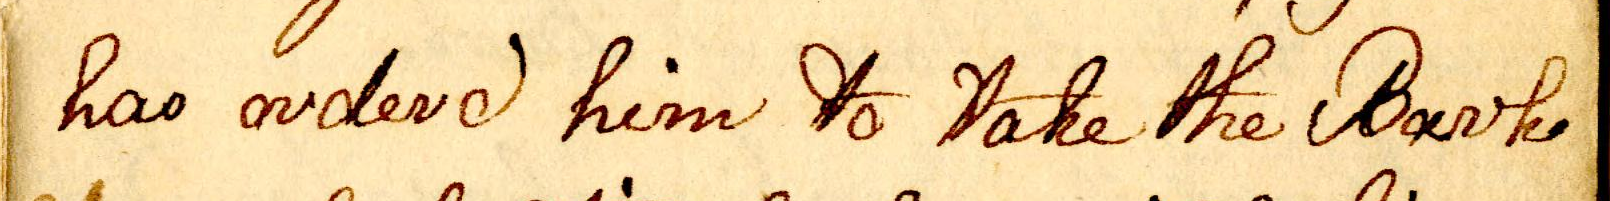has orderd him to take the Bark
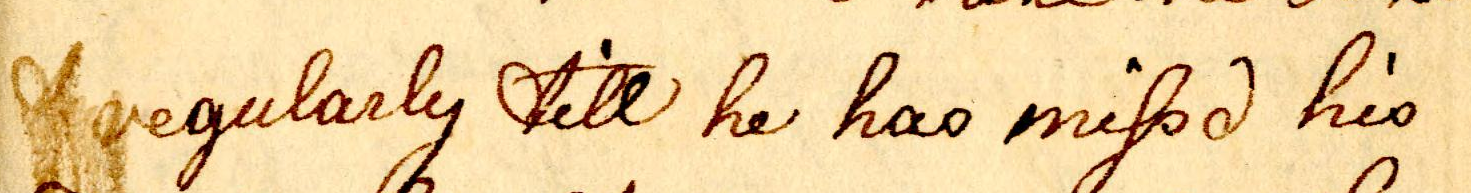regularly till he has missd his
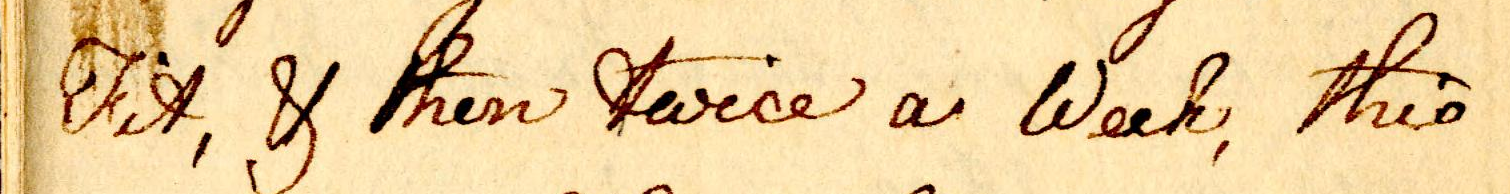Fit, & then twice a Week, this
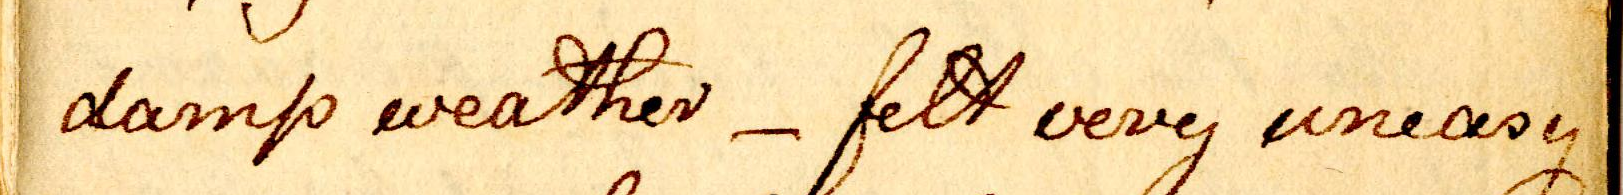damp weather- felt very uneasy
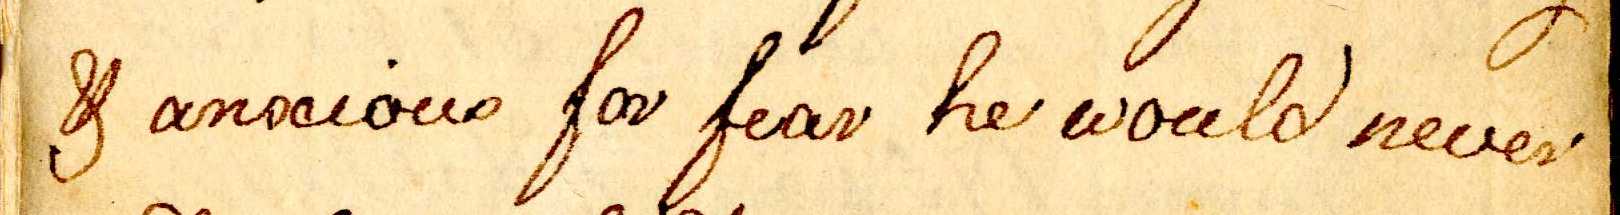& anxious for fear he would never
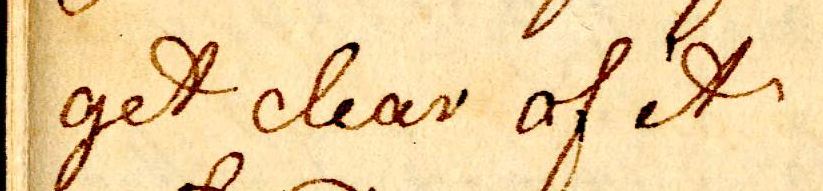get clear of it
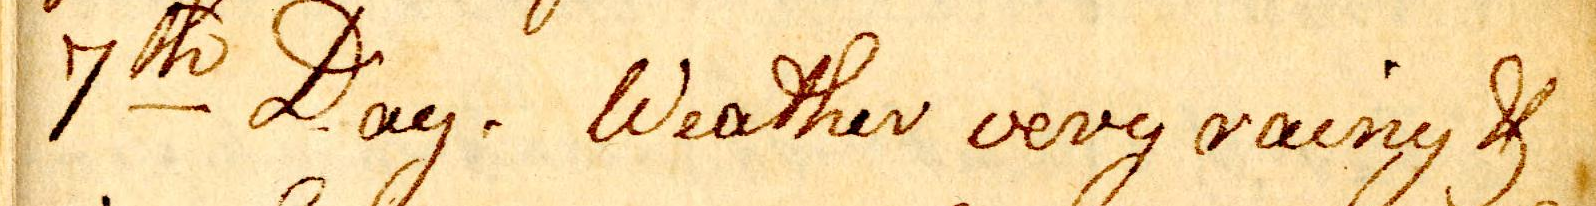7^th Day. Weather very rainy &
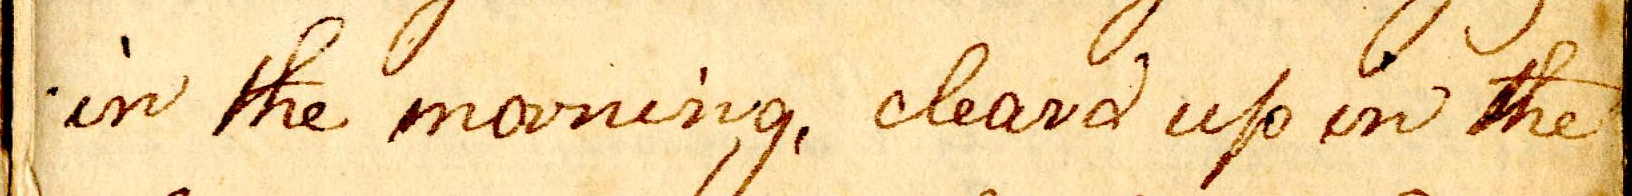in the morning, cleard up in the
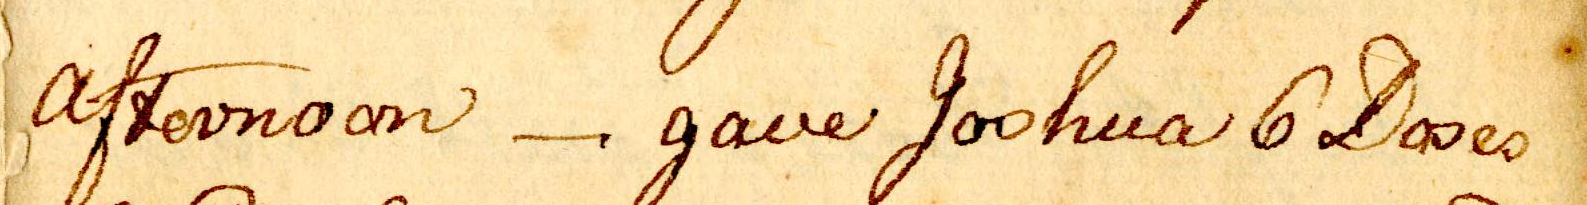Afternoon- gave Joshua 6 Doses
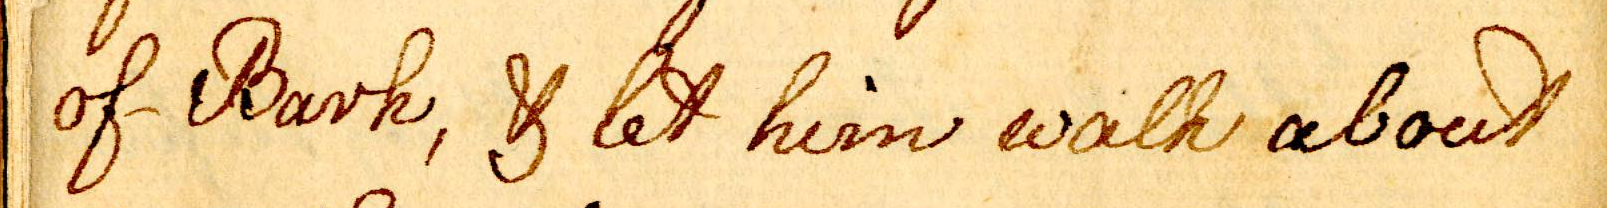of Bark, & let him walk about
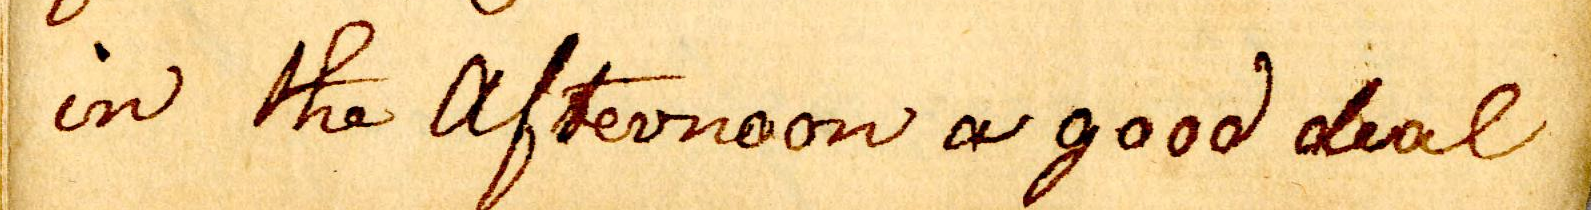in the Afternoon a good deal
